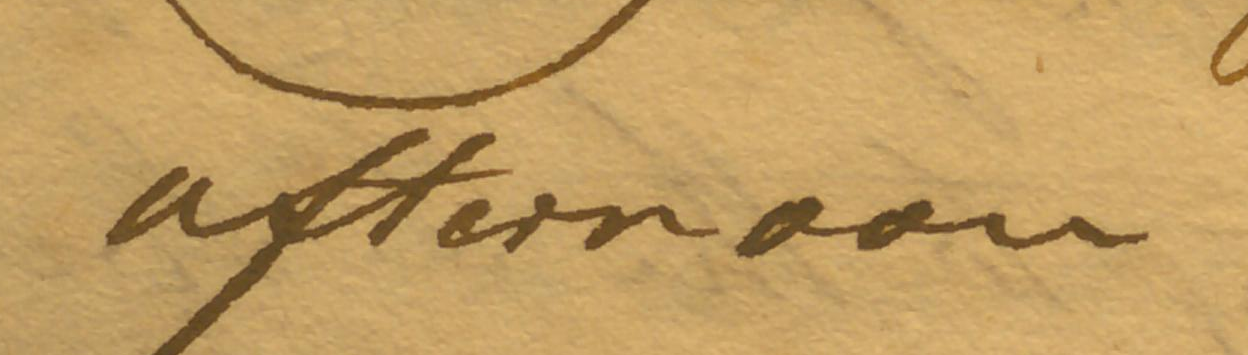afternoon
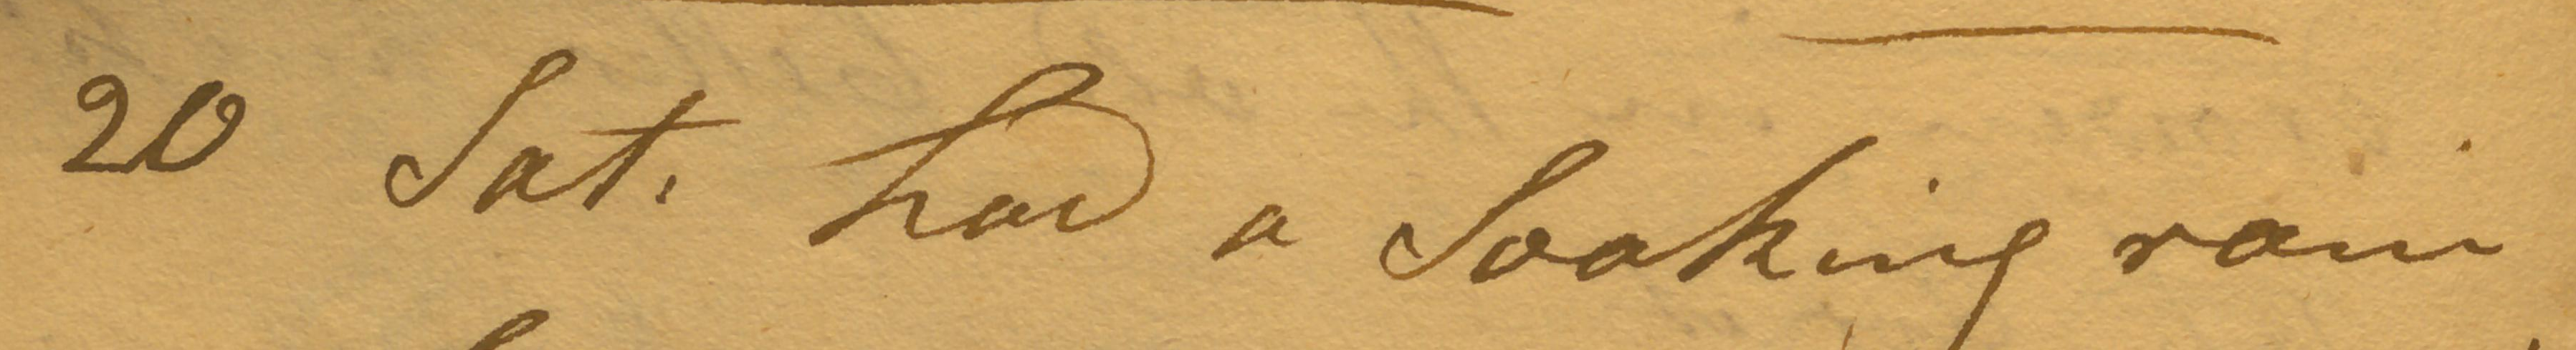20 Sat. had a soaking rain
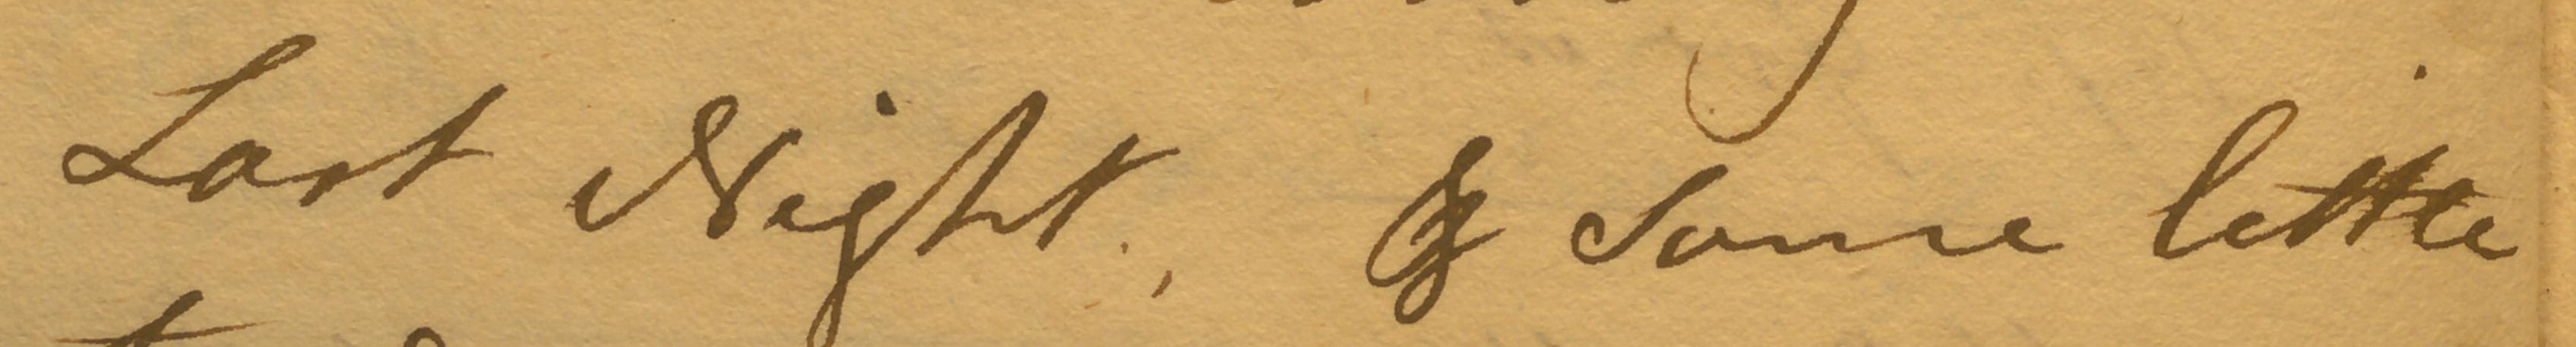Last Night & same little
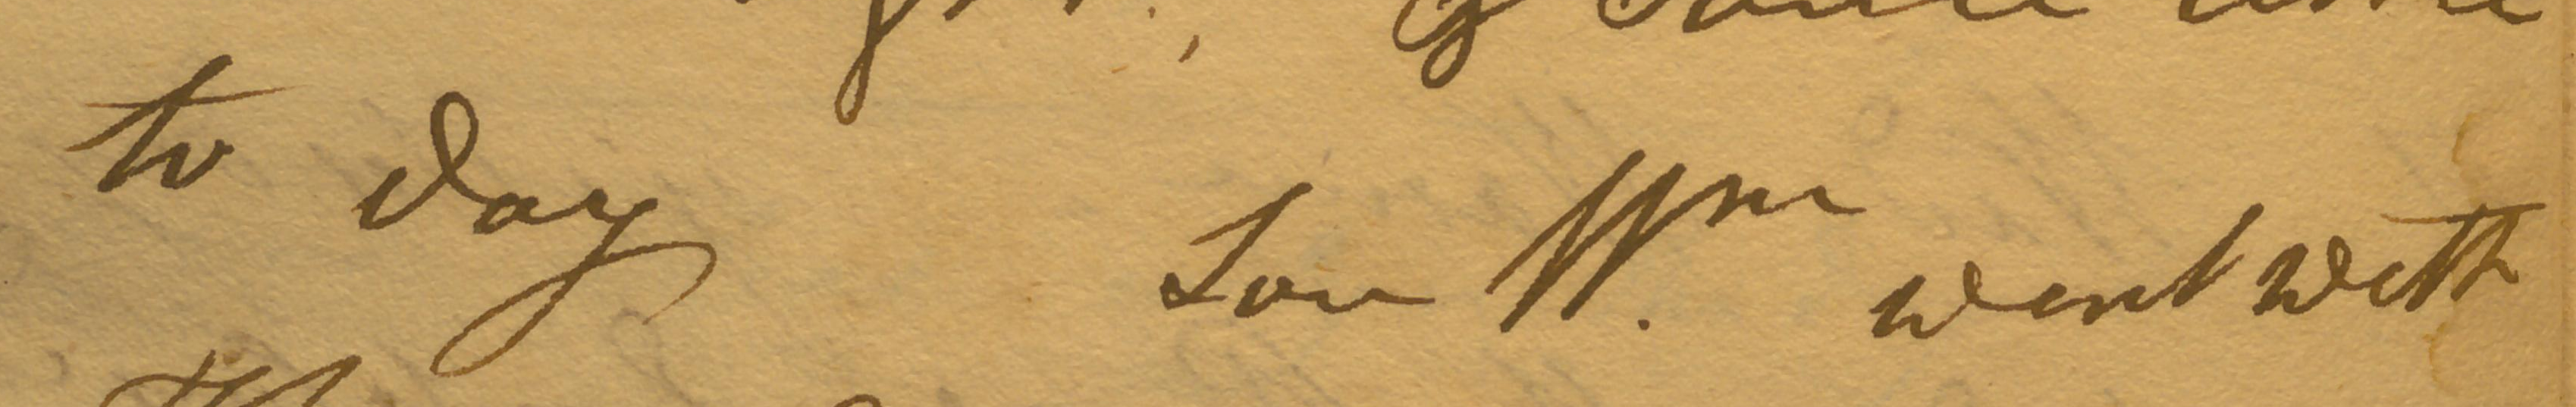to day Son W^m. went with
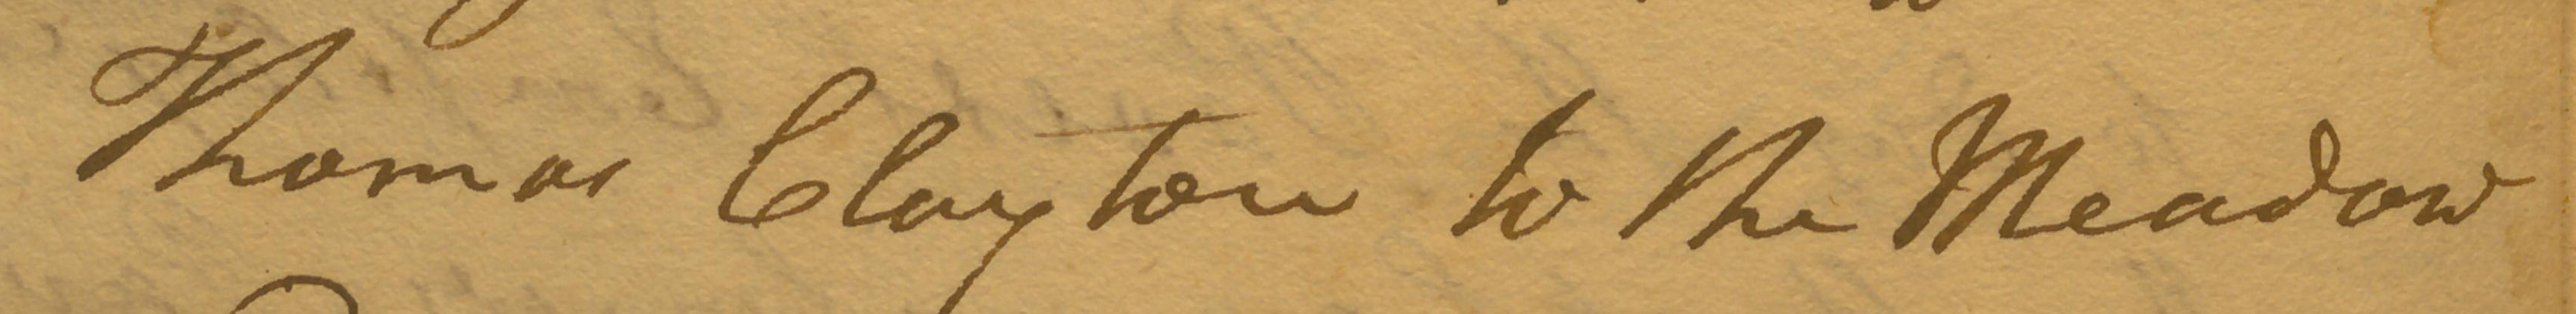Thomas Clayton to the Meadow
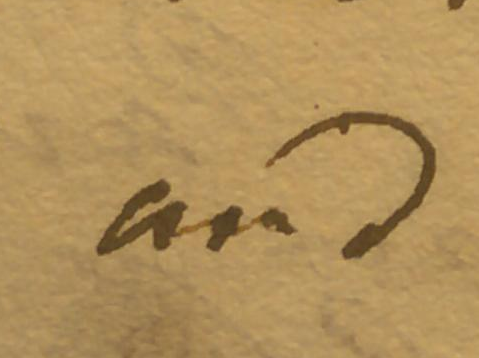and
